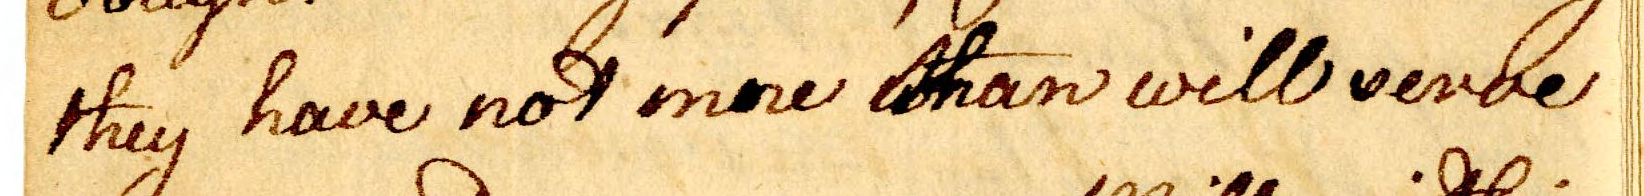they have not more than will serve
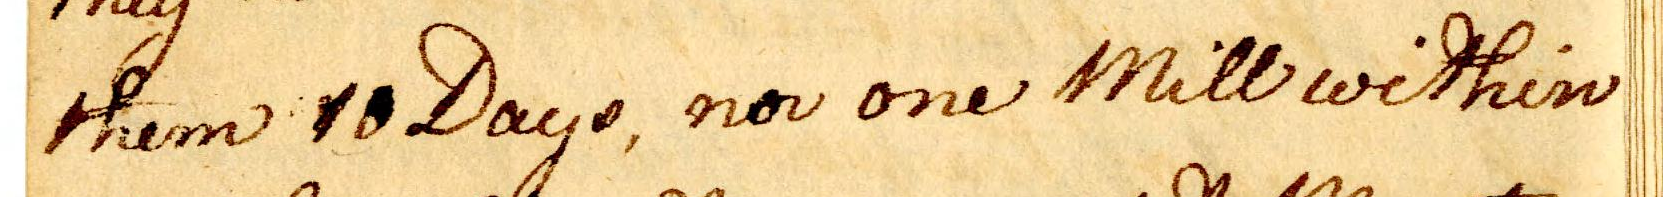them 10 Days nor one Mill within
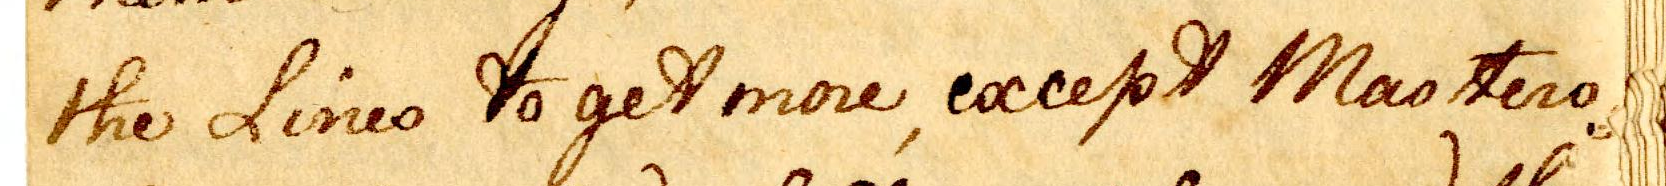the Lines to get more, except Masters
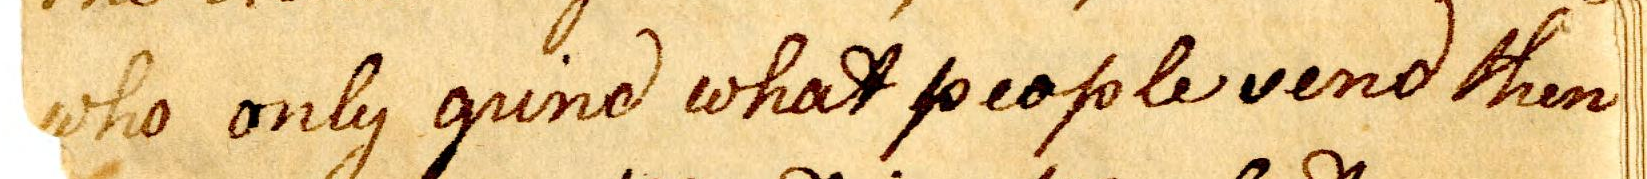who only grind what people send then
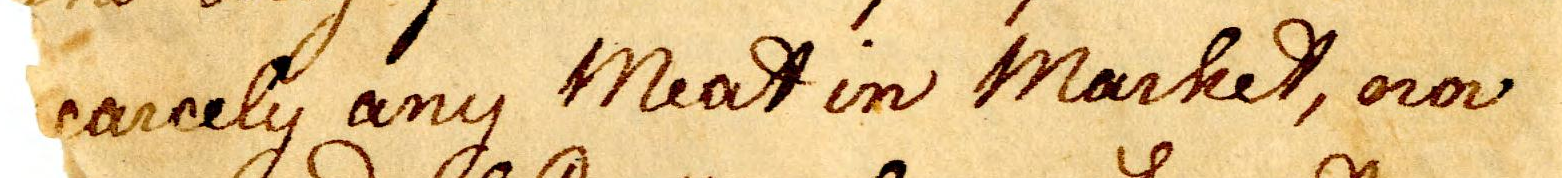carcely any Meat in Market, nor
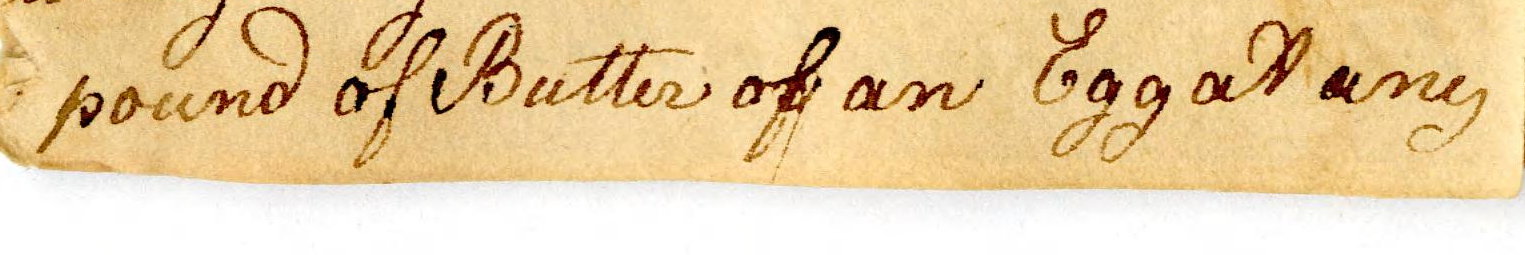pound of Butter of an Egg at any
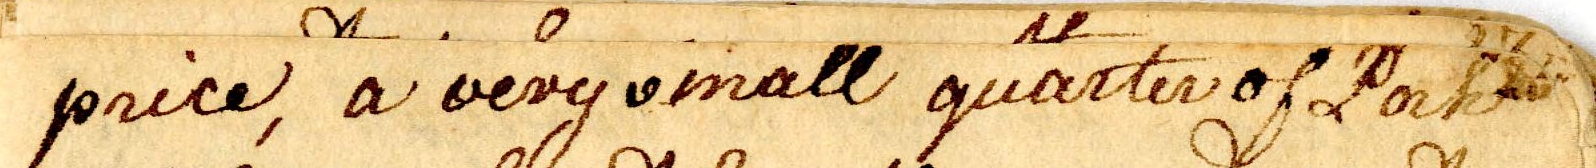price, a very small quarter of Pork
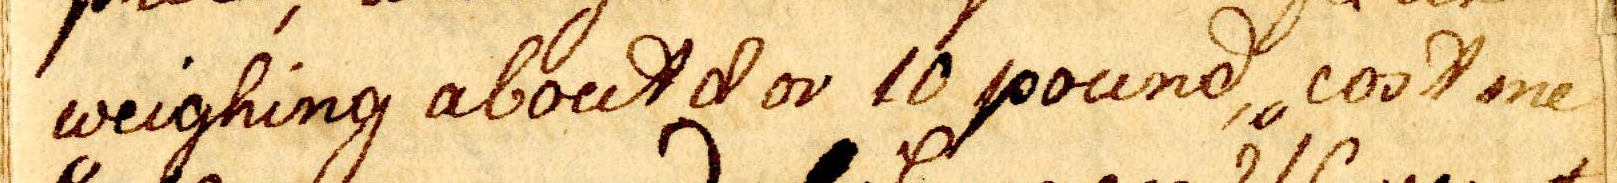weighing about 8 or 10 pound, cost me
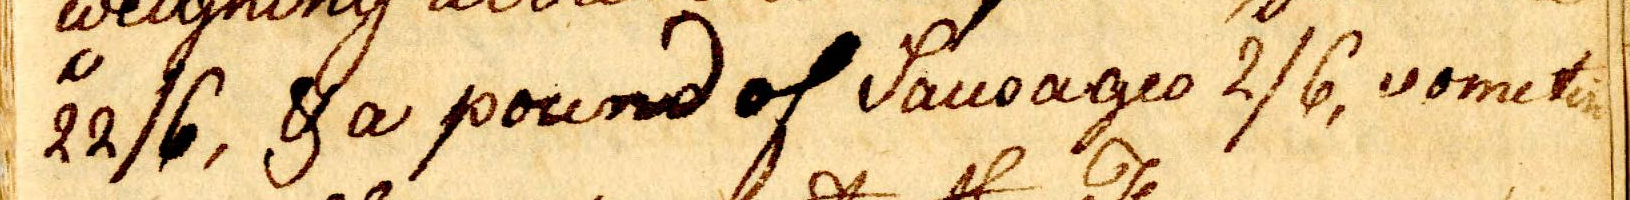22s6, & a pound of Sausages 2s 6sometin
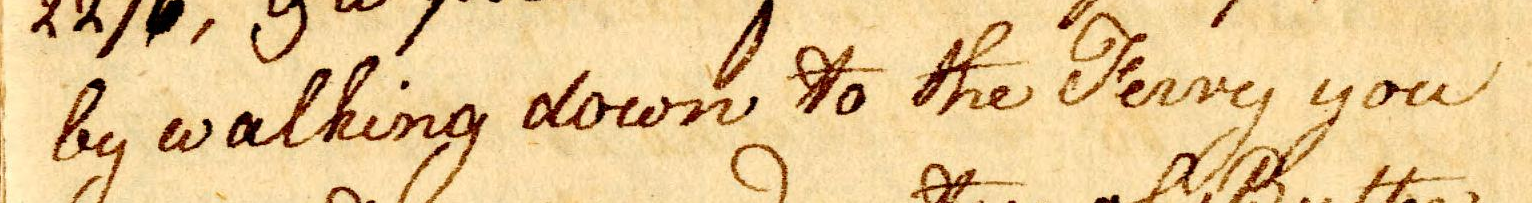by walking down to the Ferry you
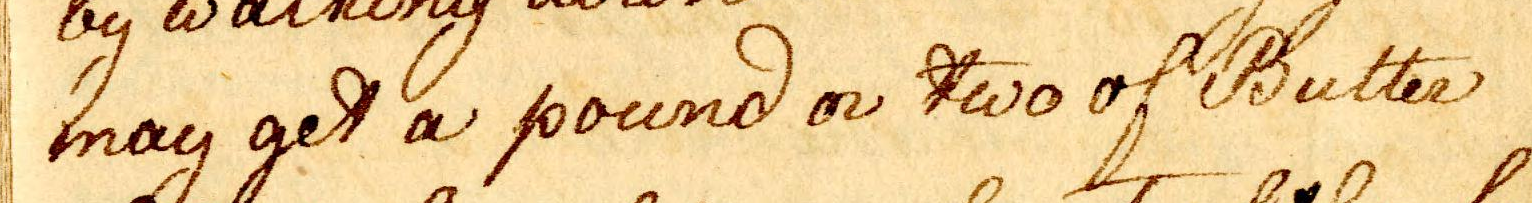may get a pound or two of Butter
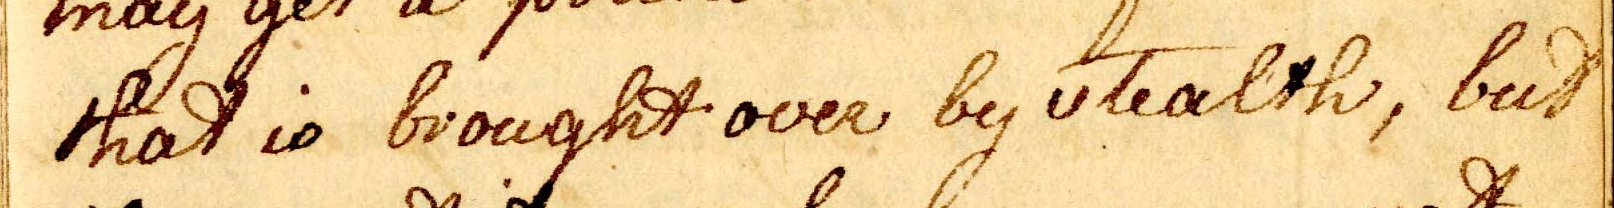that is brought over by stealth, but
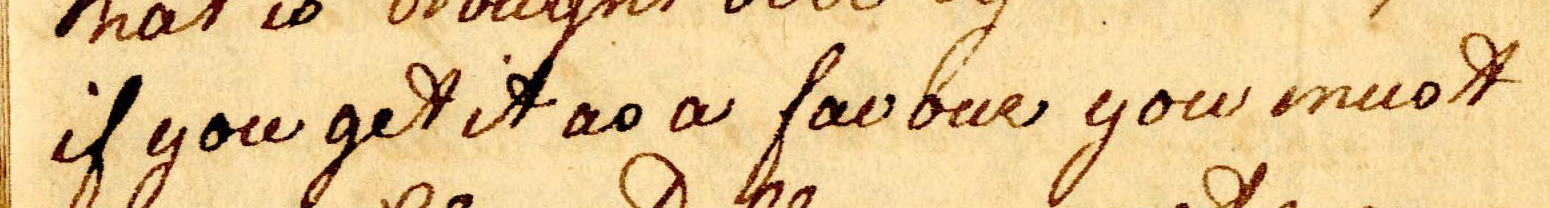if you get it as a favour you must
